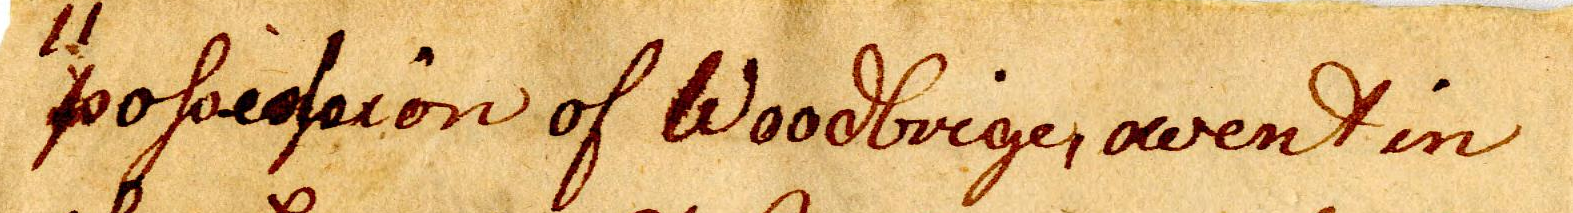possession of Woodbrige, owent in
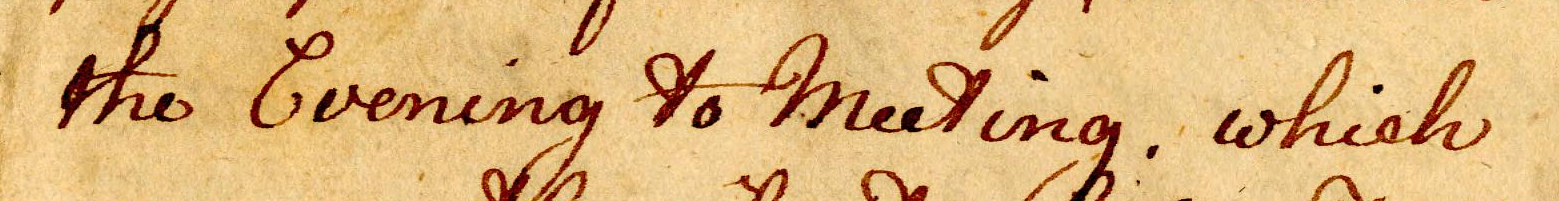the Evening to Meeting, which
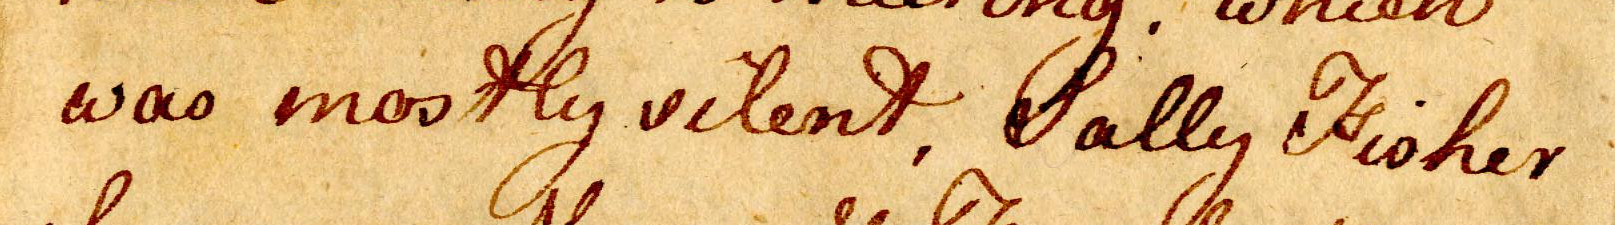was mostly silent, Sally Fisher
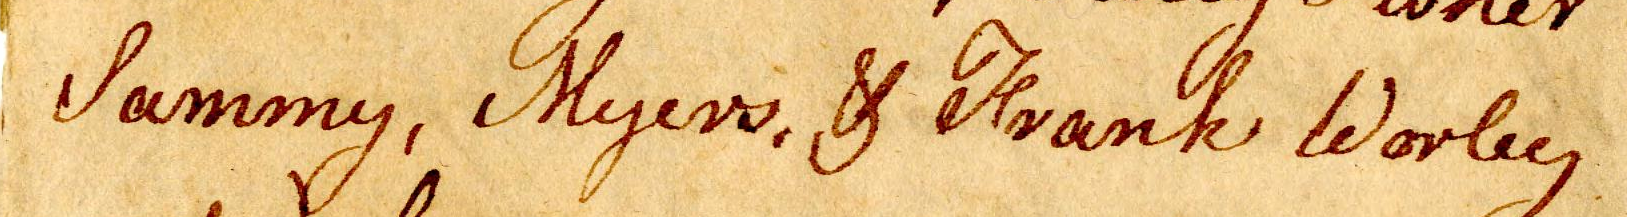Sammy, Myers, & Frank Worley
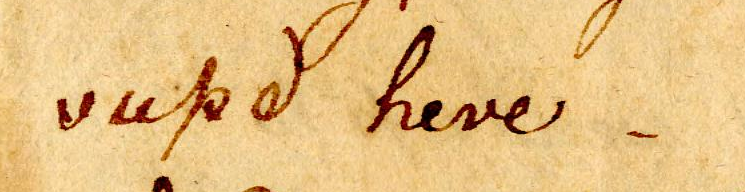supd here -
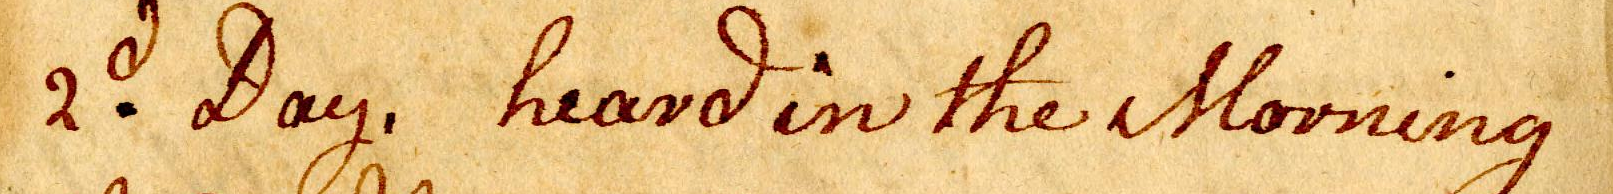2^d Day, heard in the Morning
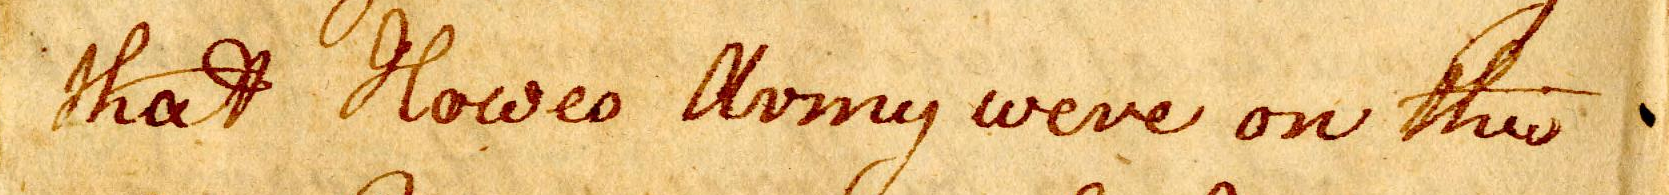that Howes Army were on this
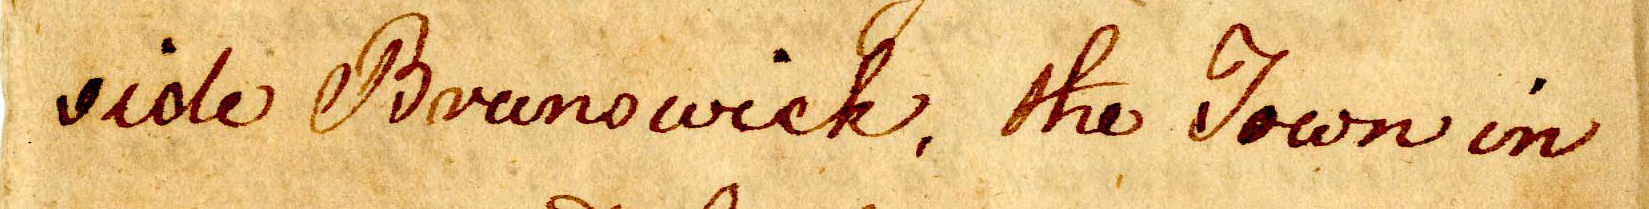side Brunswick, the Town in
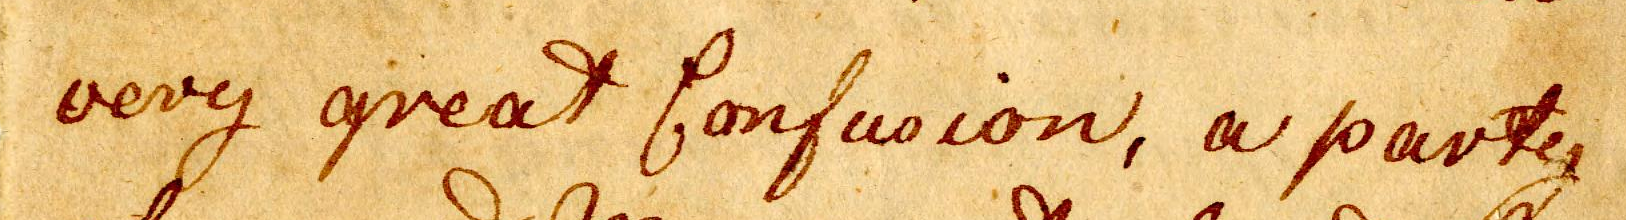very great Confusion, a party
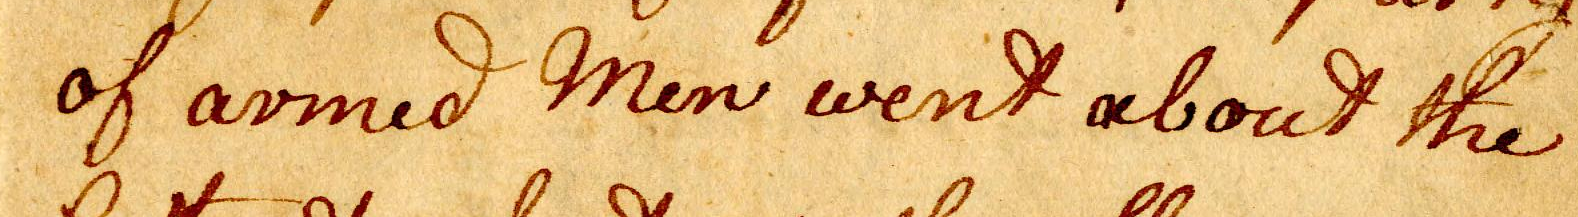of armed Men went about the
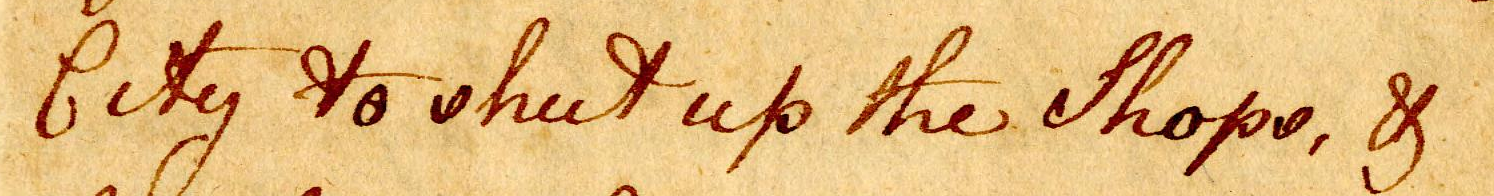City to shut up the Shops, &
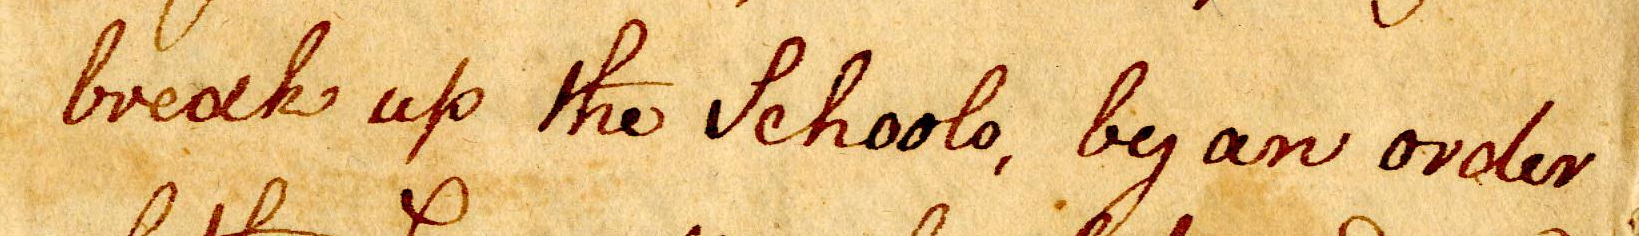break up the Schools, by an order
